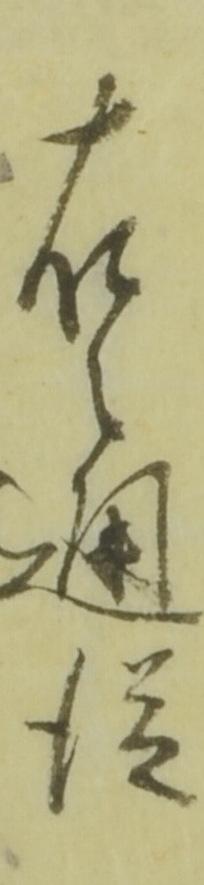右之通従
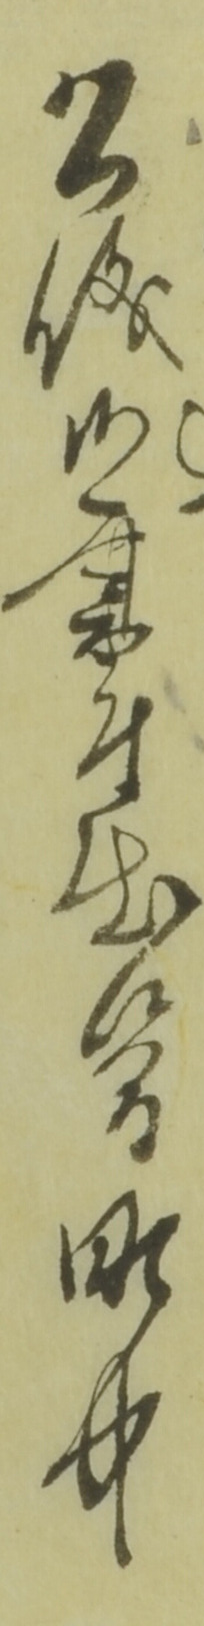公儀御書付出候間町中
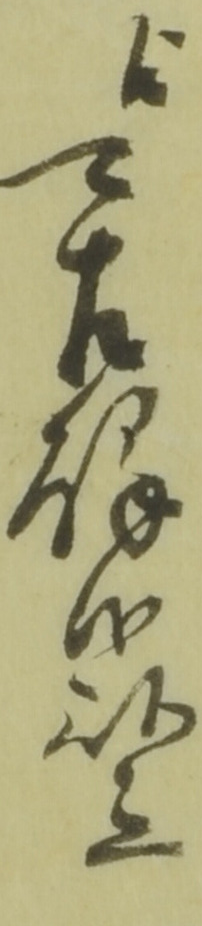江可相触候以上
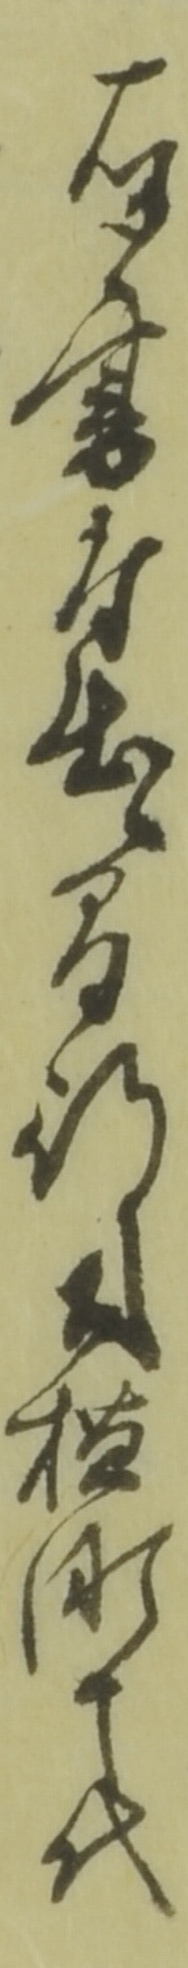右御書付出候間行司横町丁代
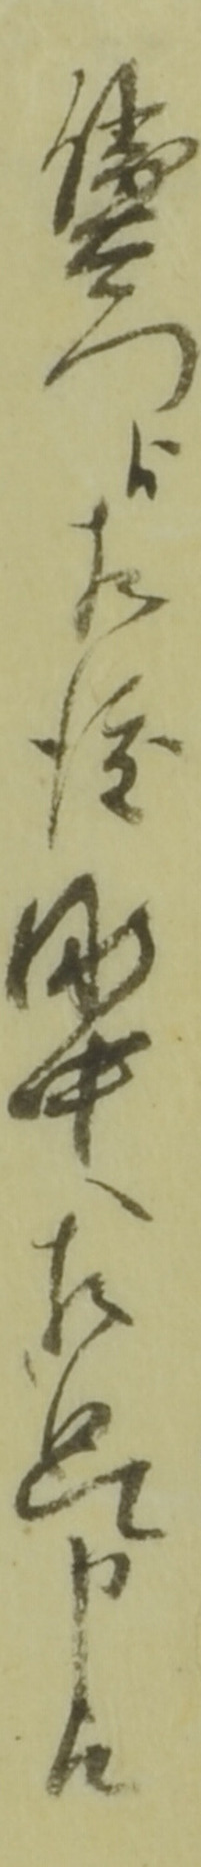勝右衛門江相渡町中へ相廻シ申候
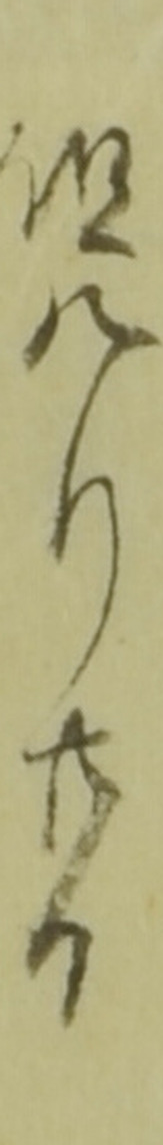但八月廿日

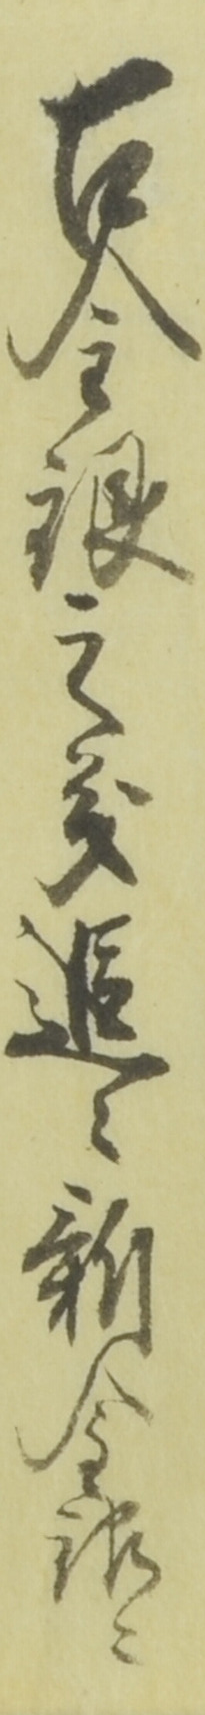古金銀之義追々新金銀ニ
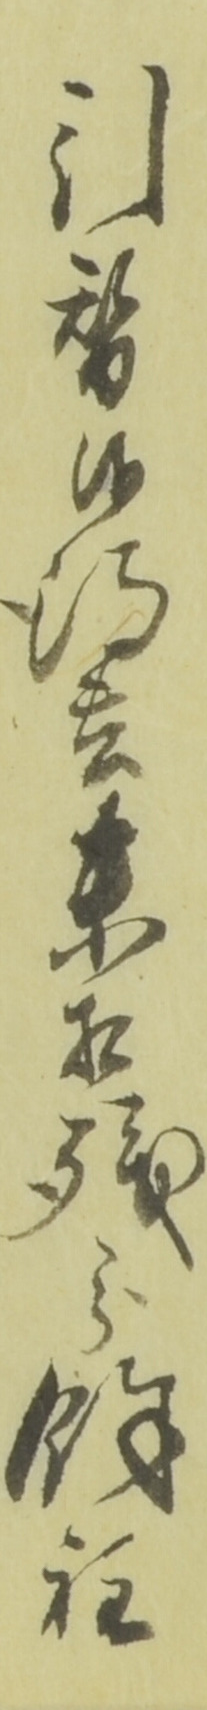引替候得共未相残分余程
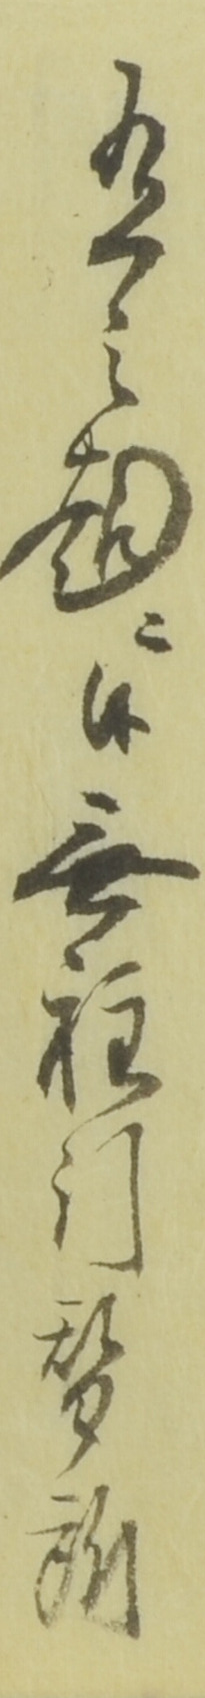有之趣ニ候無程引替所
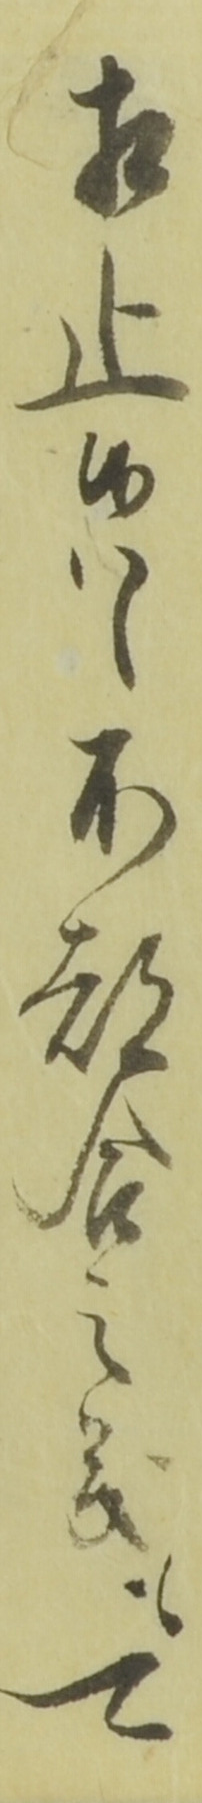相止候ハヽ不都合之義も可
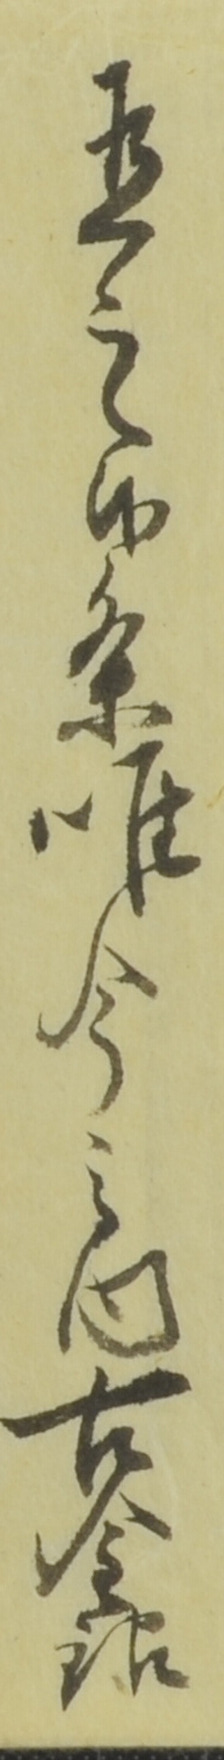有之候条唯今之内古金銀
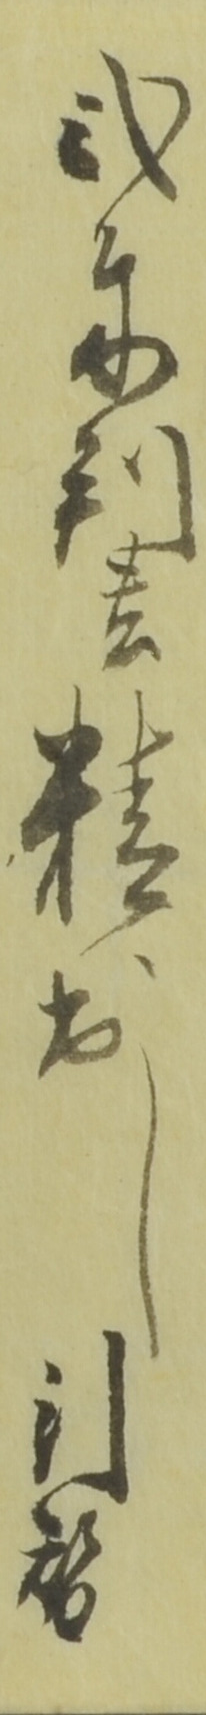弐朱判共精出し引替
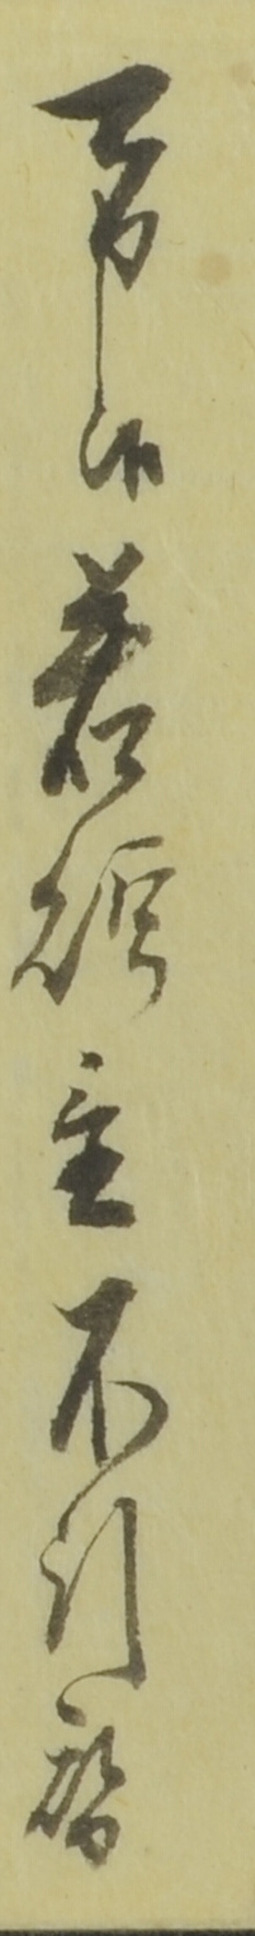可申候若貯置不引替
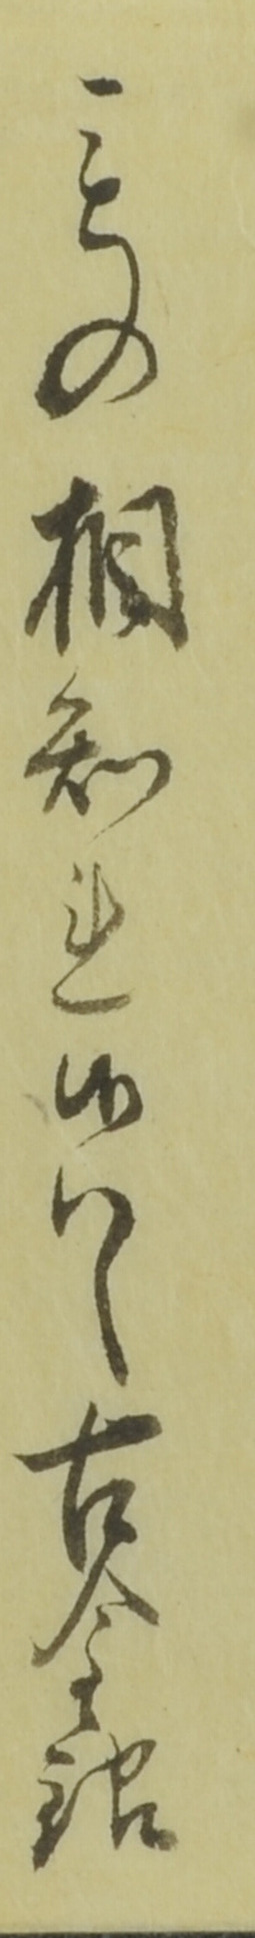もの相知れ候ハヽ古金銀
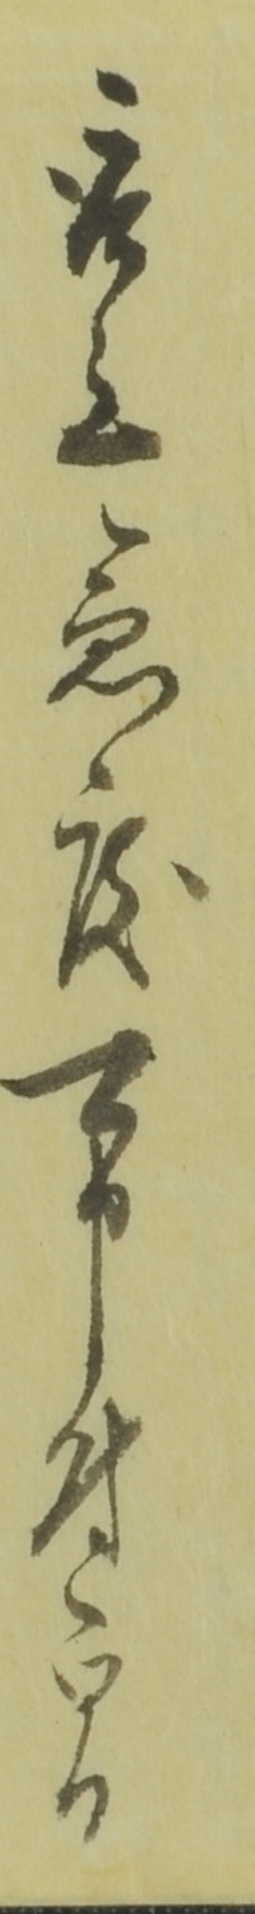取上急度可申付候間
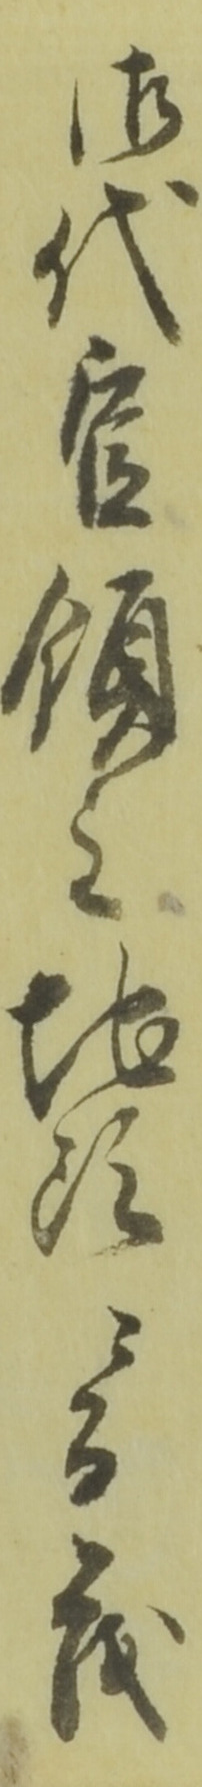御代官領主地頭ニ而も
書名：御触書御書附控
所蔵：伊那市立高遠町図書館・合同会社AMANE
